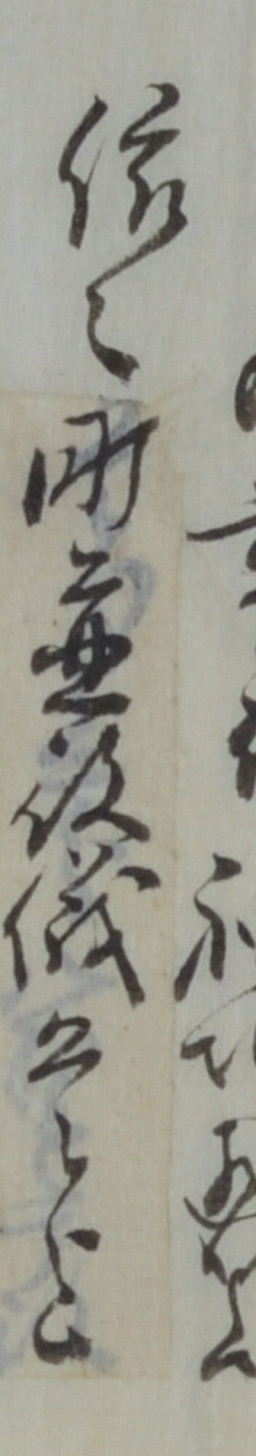依之町並役儀是迄
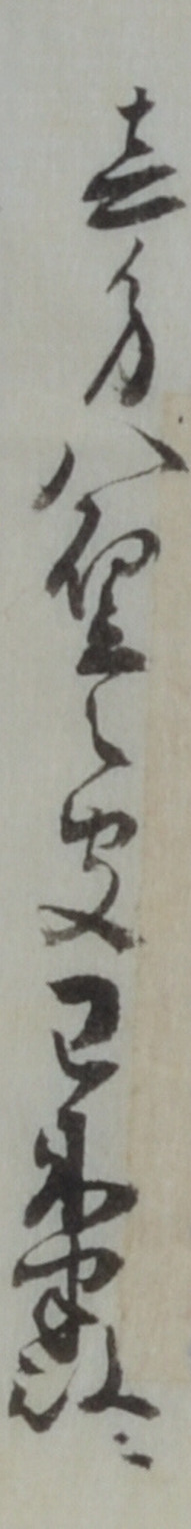壱分八厘之処已来半役ニ
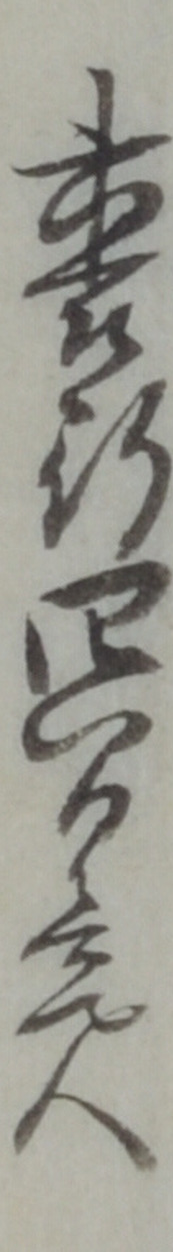裏行四間壱尺

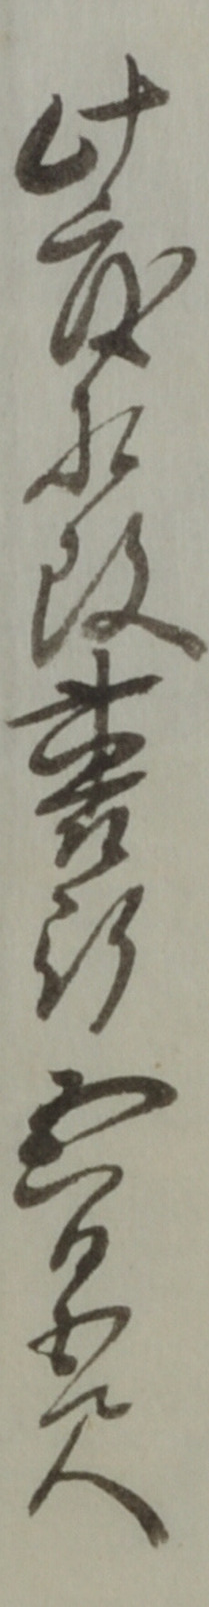此度相改裏行五間五尺
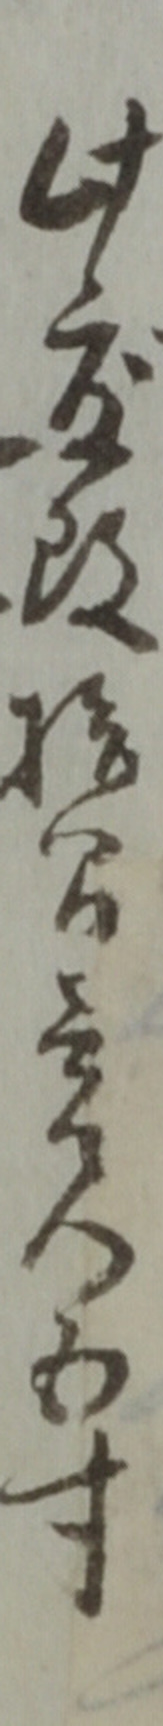此度改拾間壱尺五寸
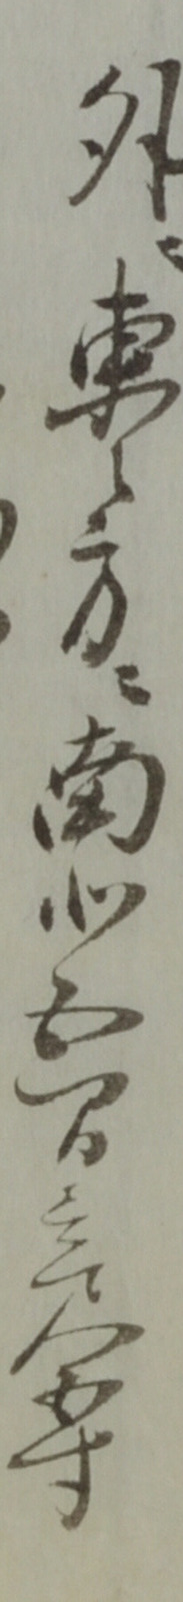外ニ東之方ニ南北五間壱尺五寸
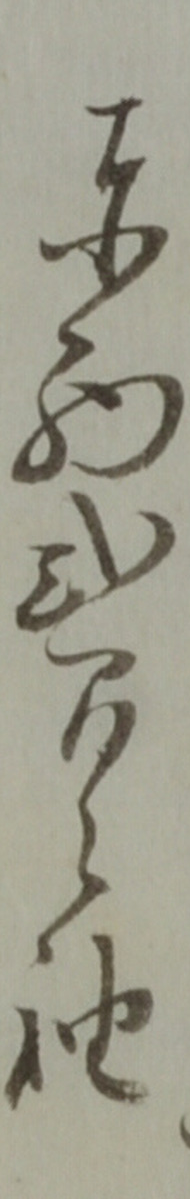東西弐間之袖
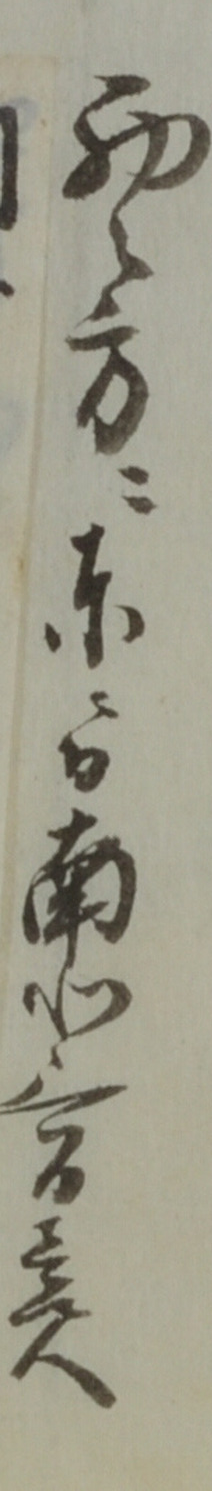西之方ニ東ニ而南北三間壱尺
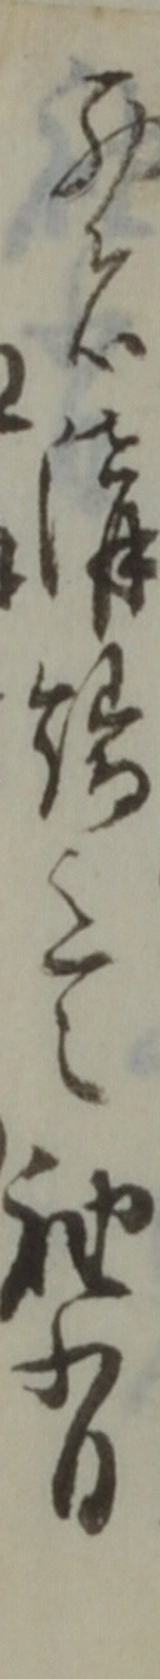西は溝場迄之袖有
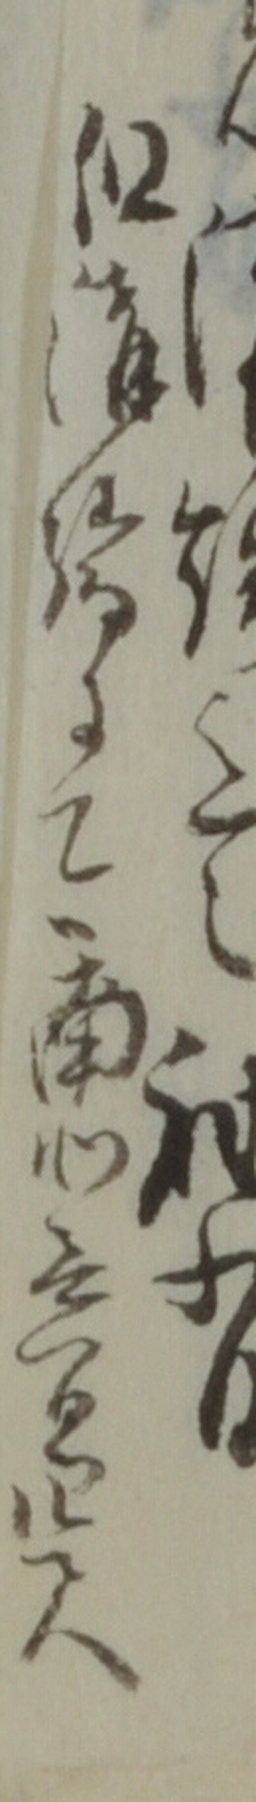但溝場にてハ南北壱間四尺
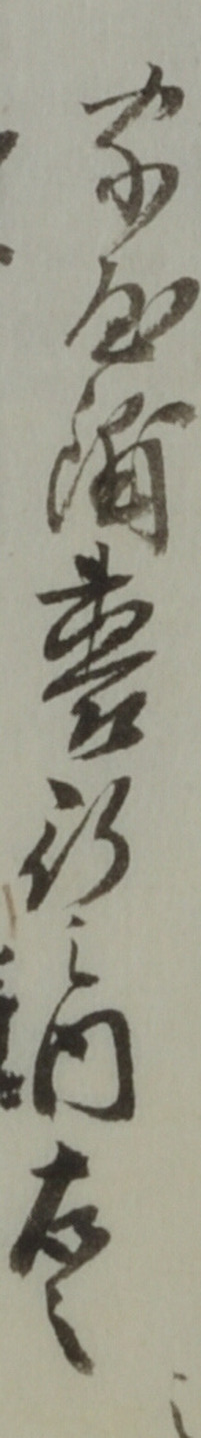家屋鋪裏行之内右之
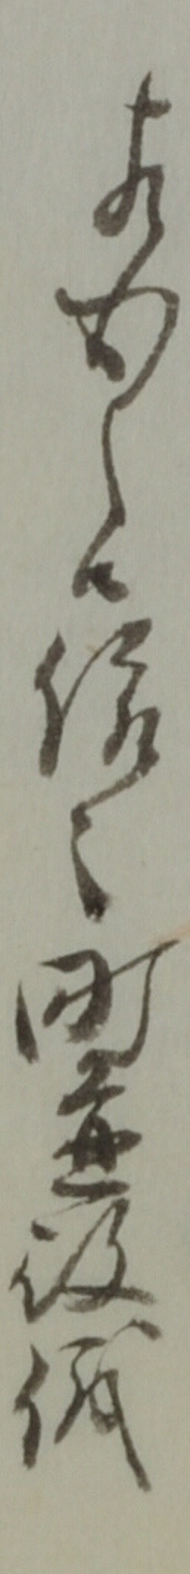相成申候依之町並役儀
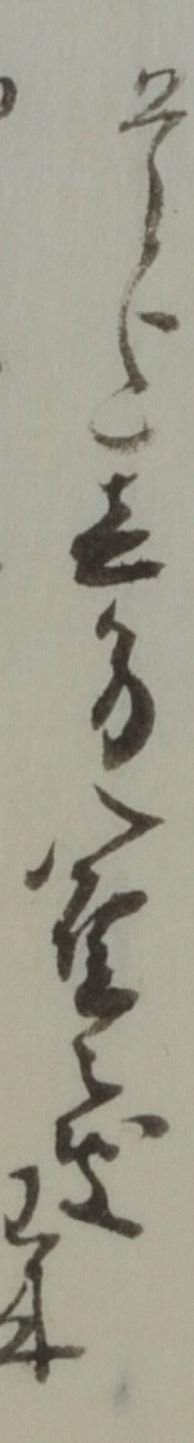是迄壱分八厘之処已来
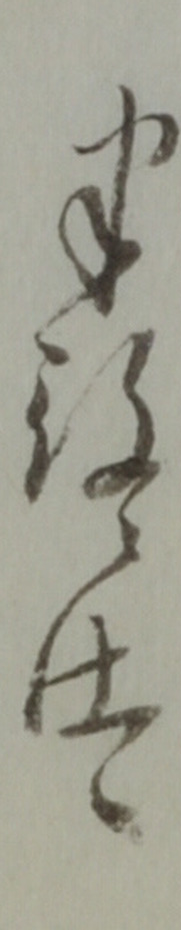半役ニ仕候
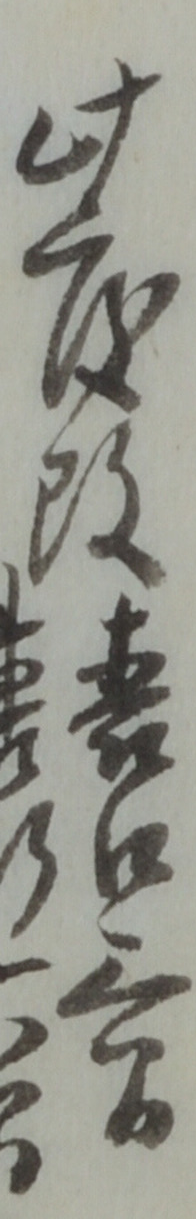此度改表口三間
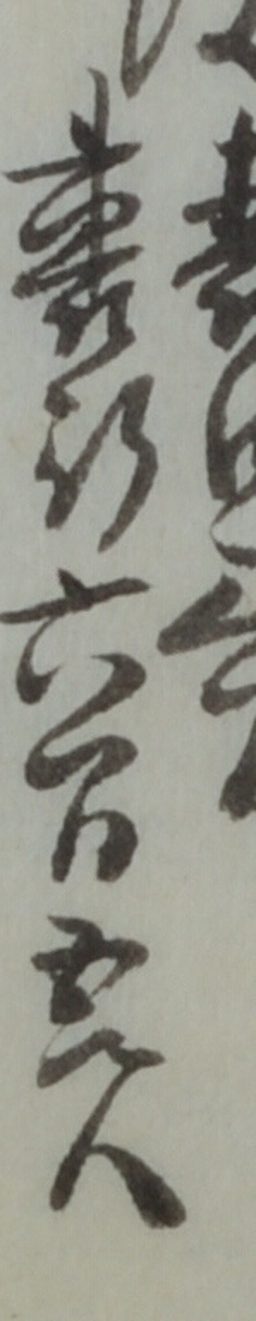裏行六間五尺
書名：屋敷表口裏行書上
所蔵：伊那市立高遠町図書館・合同会社AMANE
